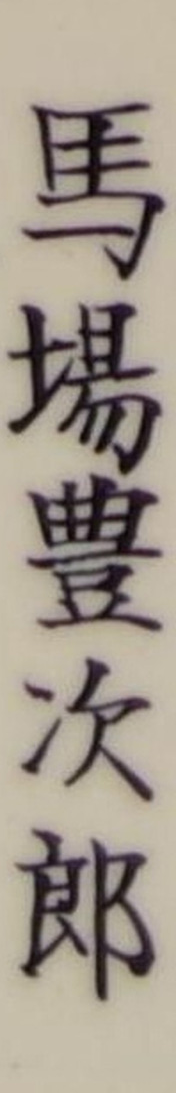馬場豊次郎
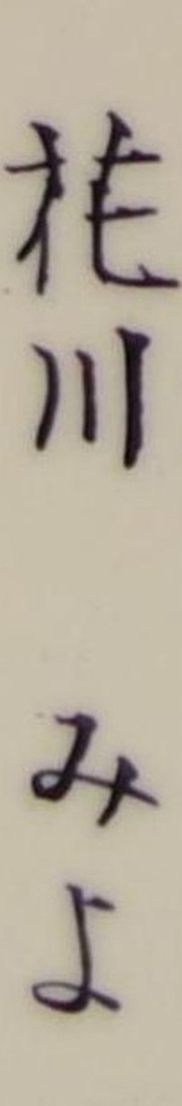花川みよ
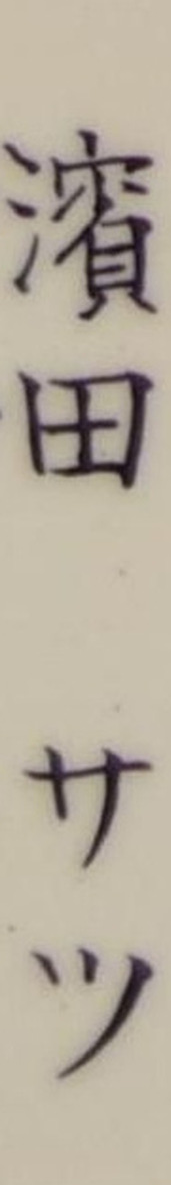濱田サツ
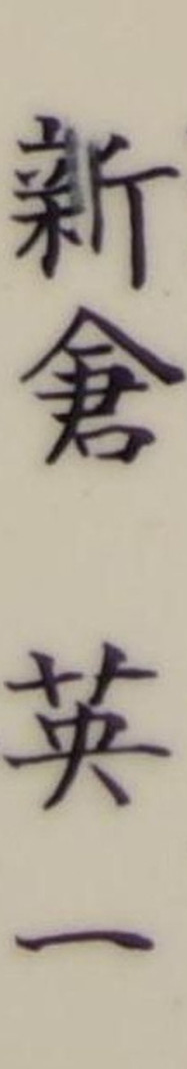新倉英一
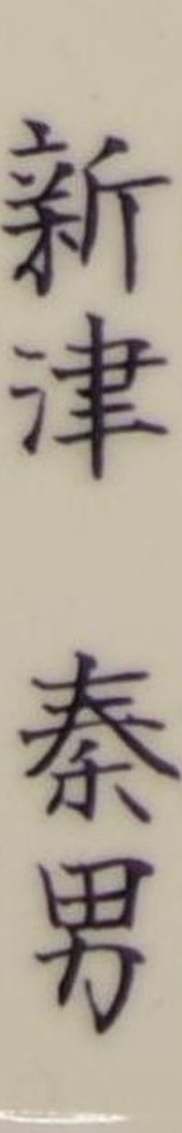新津秦男
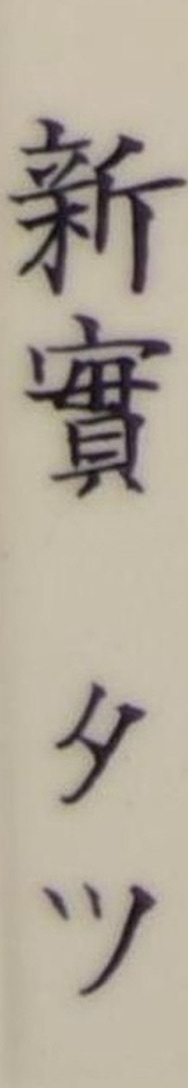新實タツ

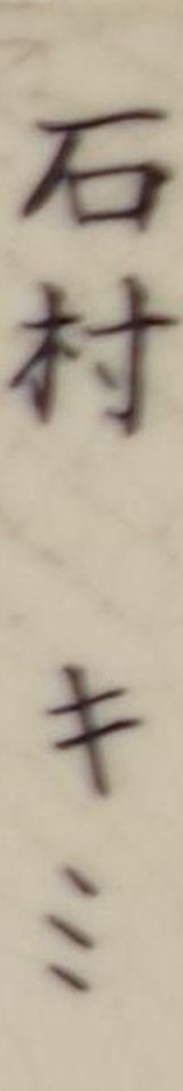石村キミ
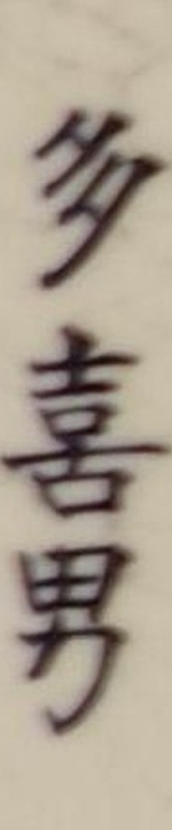多喜男
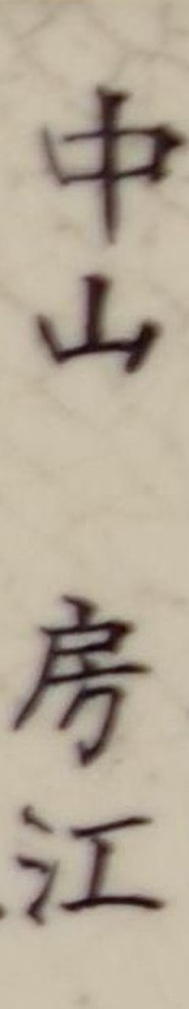中山房江
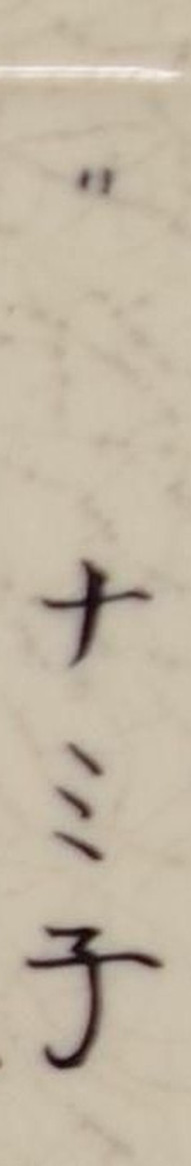ナミ子
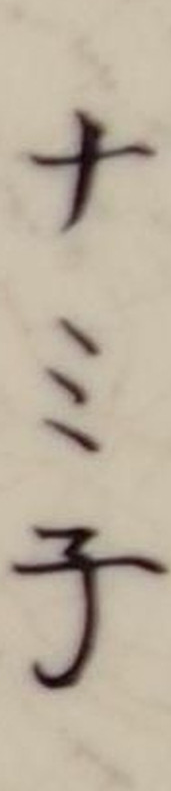ナミ子
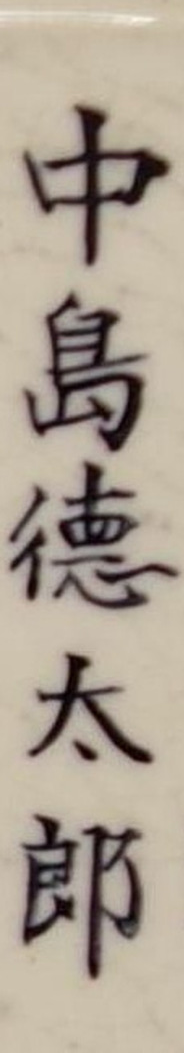中島徳太郎
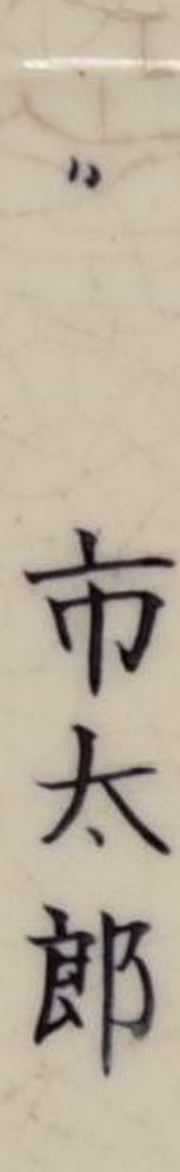市太郎
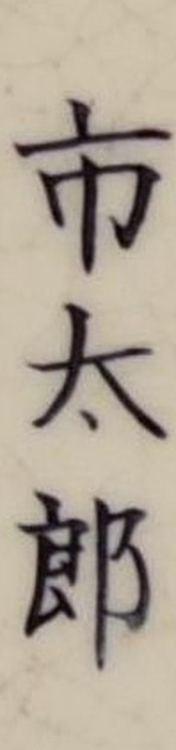市太郎
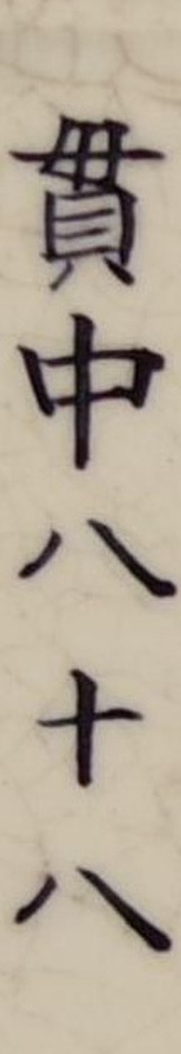貫中八十八
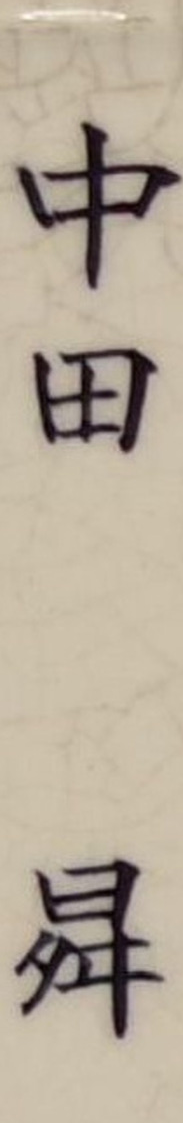中田昇
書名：M~S
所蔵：高野山金剛峯寺
